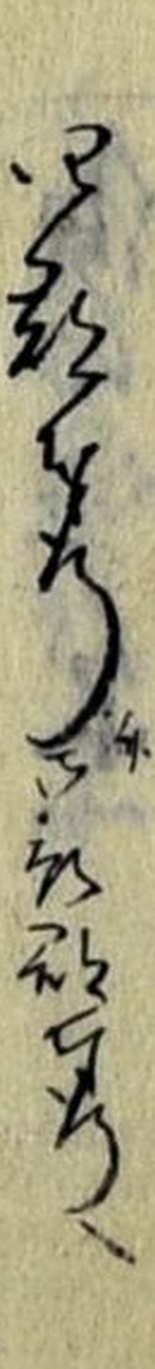四郡奉行并御預所奉行へ
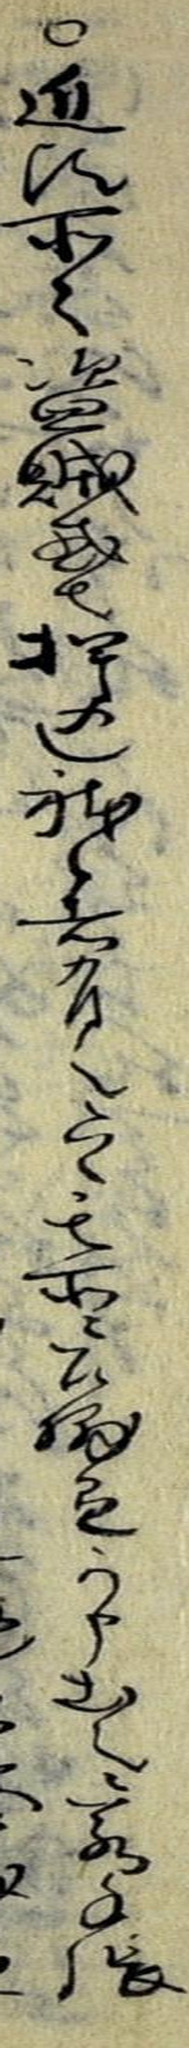〇近頃所々盗賊或者押込体之者有之候ハヽ其所ニ召捕置可申出之ニ若手張
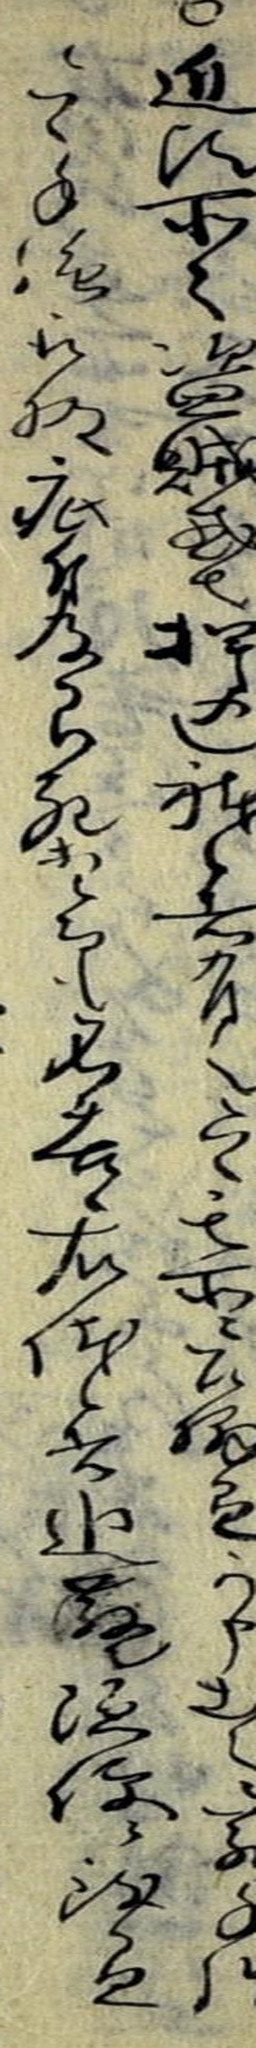候ハヽ手強取扱疵付及即死等ニ而も不苦候右体之者追散シ隠便ニ致置
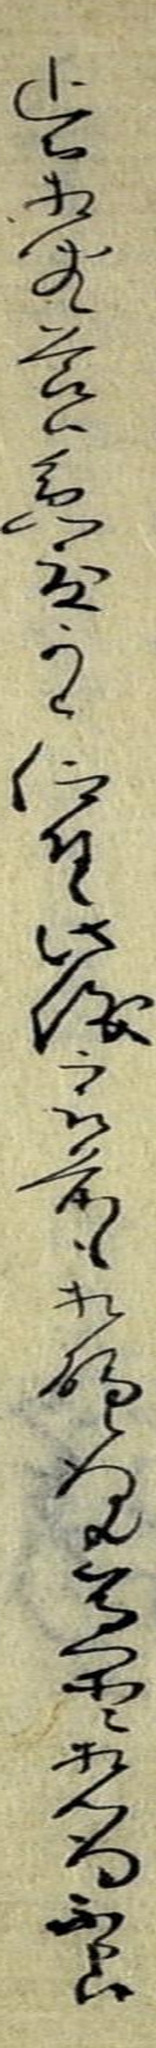追而相聞候節ハ急度可被仰付候此儀最前も相触候得共等閑ニ相心得不申候
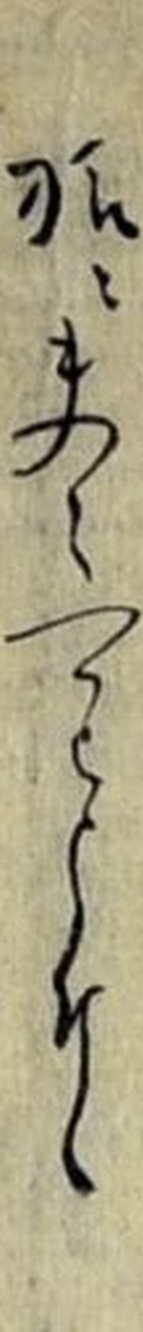様ニ夫々可被申付候
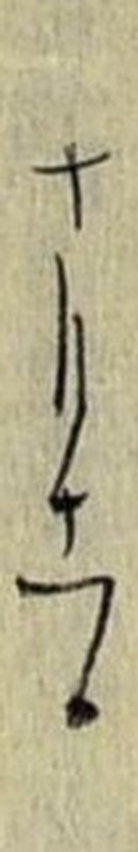十月十一日
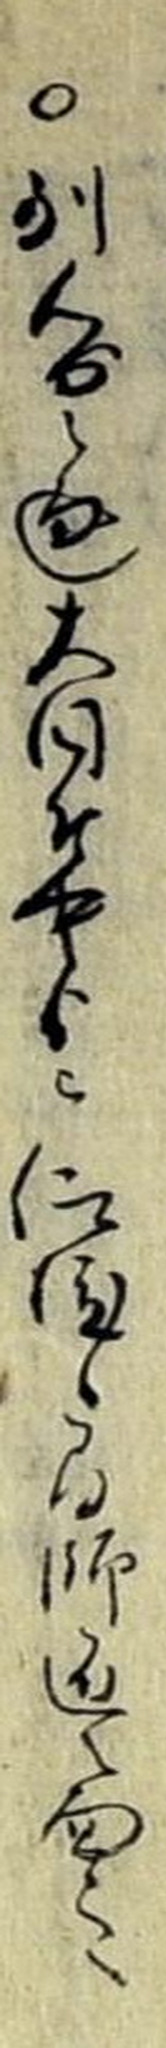〇別紙之通大目付中ゟ被仰渡候間師匠之面々へ
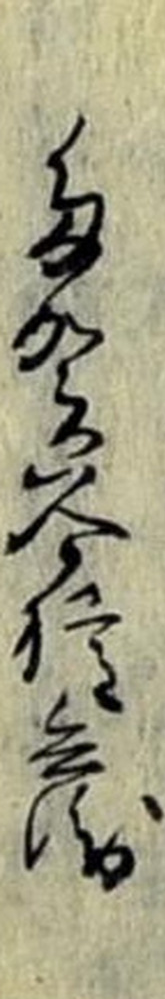多賀谷権兵衛
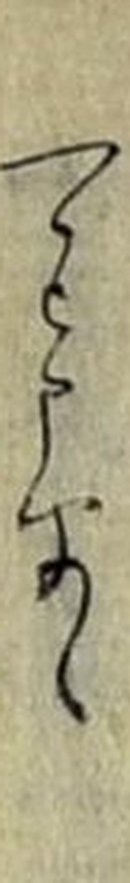可被申聞候
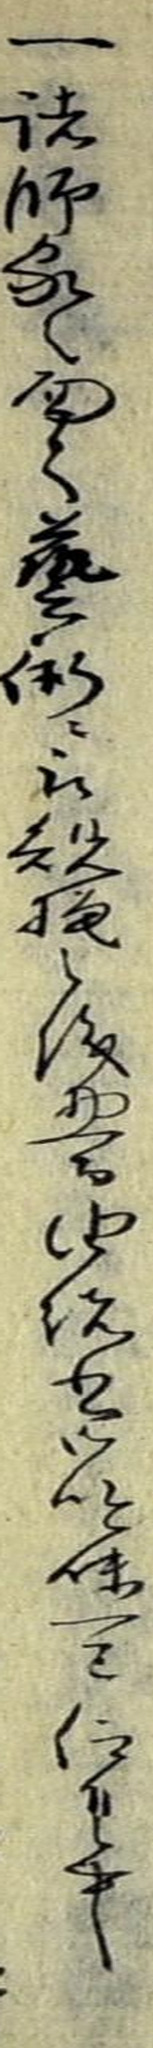一諸師家之面々へ芸術ニ取規模之儀惣而由緒諸書御吟味可被仰付候事
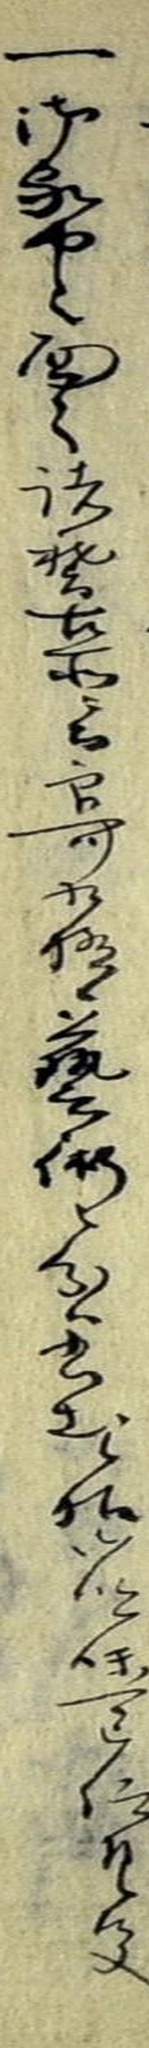一御家中之面々へ諸稽古所ニ而印可相極候芸術之分ハ書出候様御吟味可被仰付候事
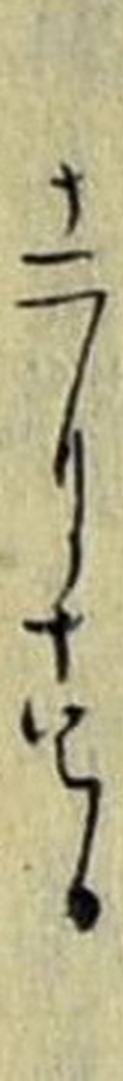十二月十四日

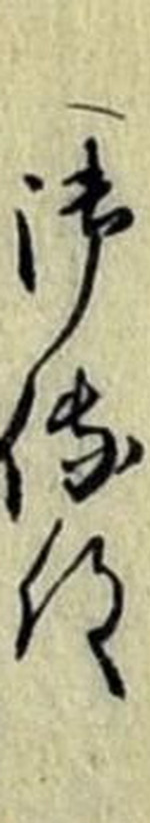御傅役
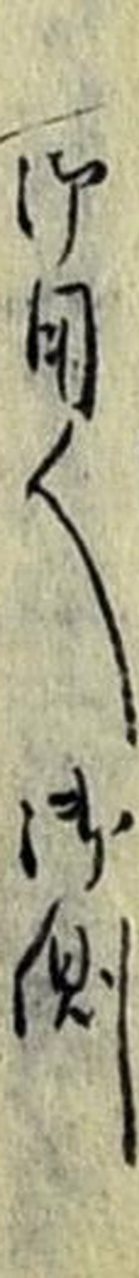御用人御側
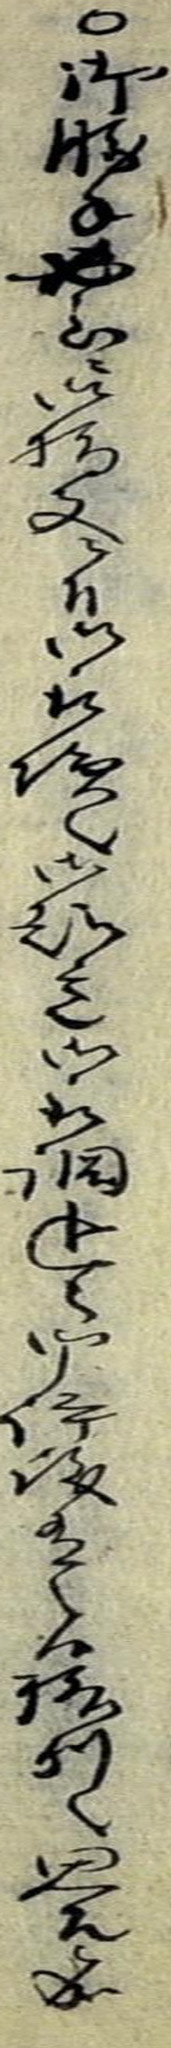〇御勝手必至ニ御指支ニ付御取続之御趣意御取調追々御評議有之候格別之思召被成
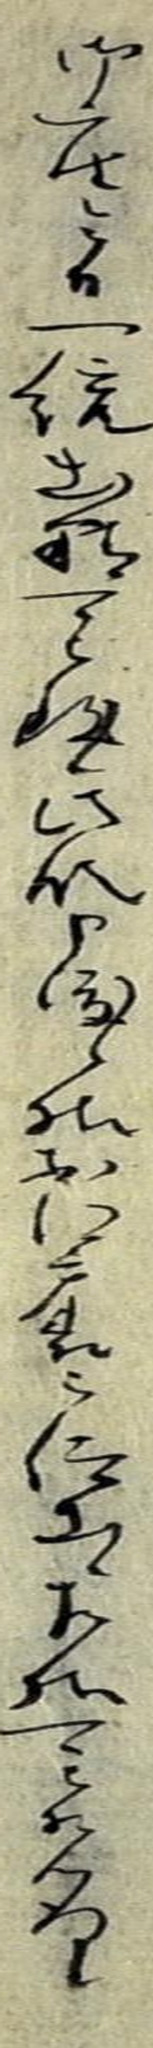御座候ニ付一統出精可被致候此段申渡候様於江戸表被仰出候左様可被相心得候
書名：命令之部 三
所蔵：福井県文書館 Fukui Prefectural Archives
